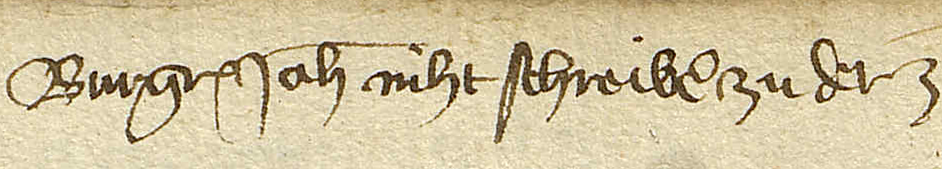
Burgr* Ioh* niht ſchreibe* cʒu der ʒ*
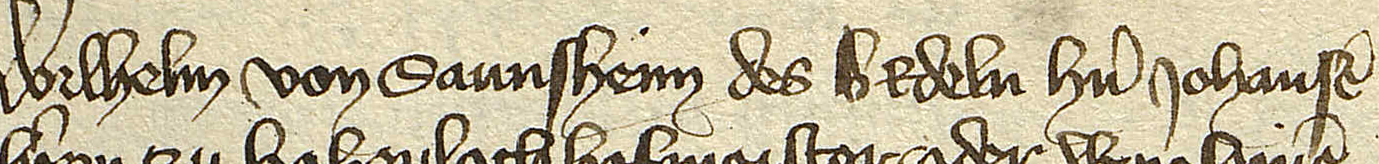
Wilhelm von Saunſheim des % Edeln hn* Iohanſe*
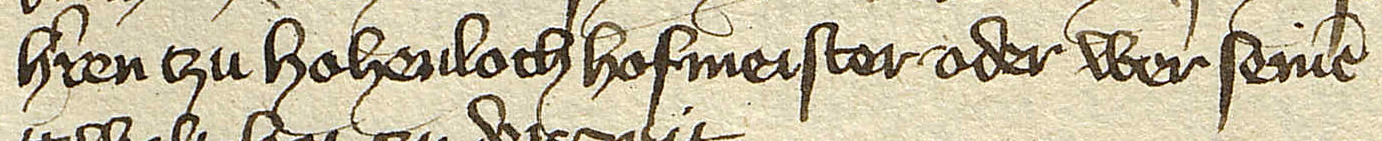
h*ren cʒu hohenloch hofmeiſter / oder wer ſeine*
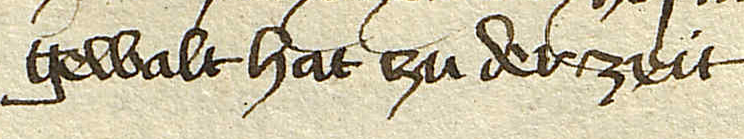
gewalt hat cʒu der cʒeit
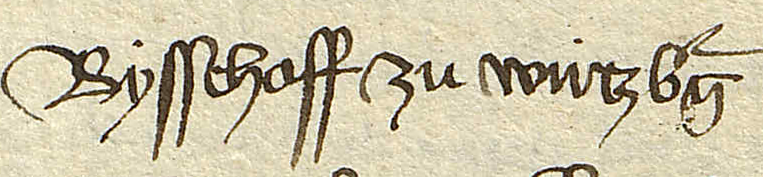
Byſſchoff cʒu wircʒb*g
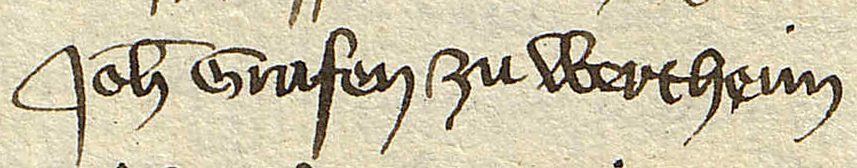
Ioh* Grafen cʒu Wertheim
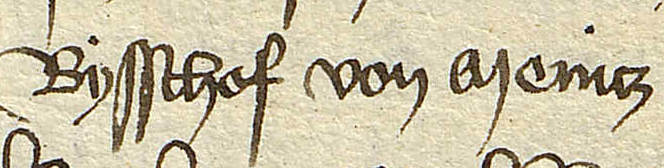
Byſſchof von Meincʒ
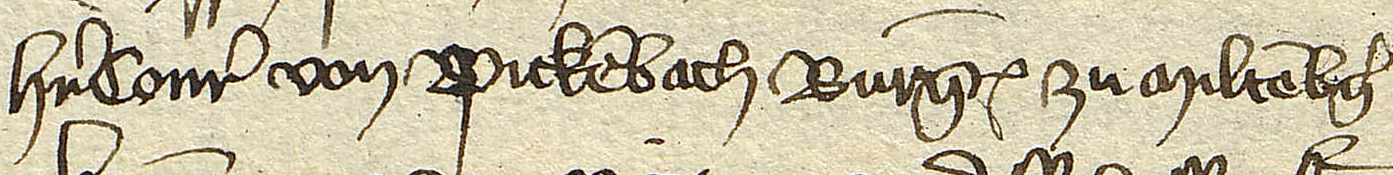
hn* Conr* von Picke*bach Burgr* cʒu Milte*bg*
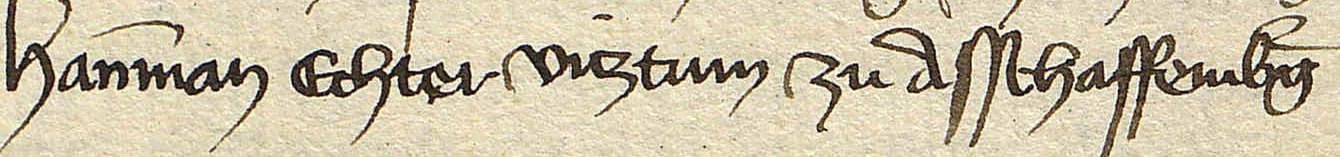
hanman* Echter vicʒtum cʒu Aſſchaffemb*g
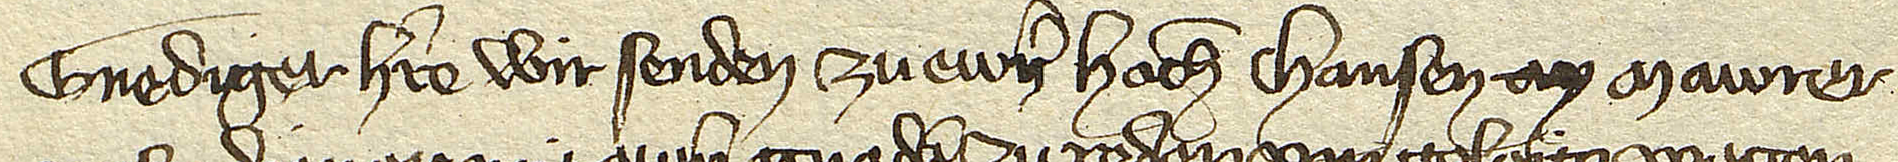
Gnediger h*re wir ſenden cʒu ewn* hoch* / hanſen M Mawrer
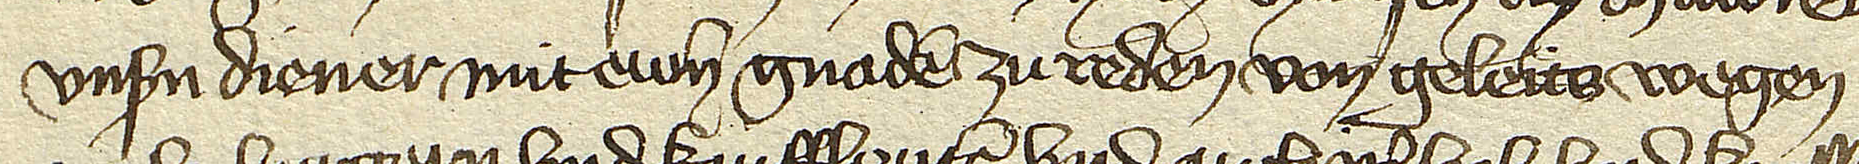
vnſ*n diener mit ew*n gnade* cʒu reden von geleits wegen
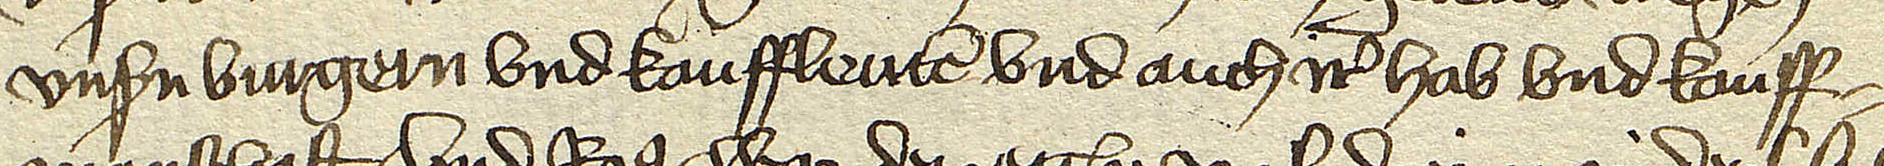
vnſ*n burgern vnd kauffleute* vnd auch ir* hab vnd kauff =
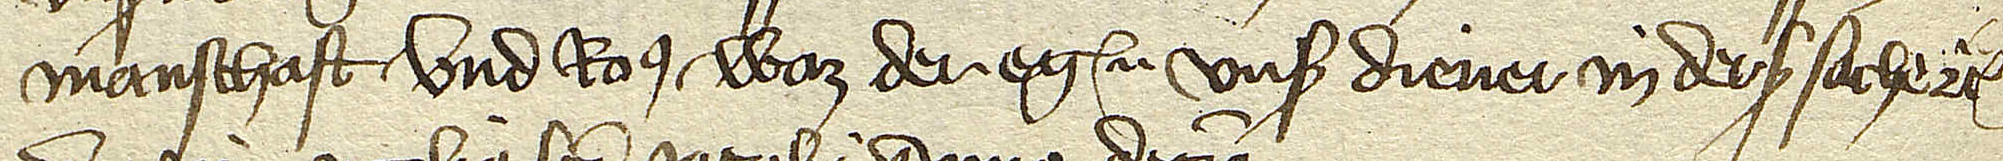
manſchaft / vnd Ro* / waʒ der eg* ~ vnſ* diener in derſ* ſache ec*
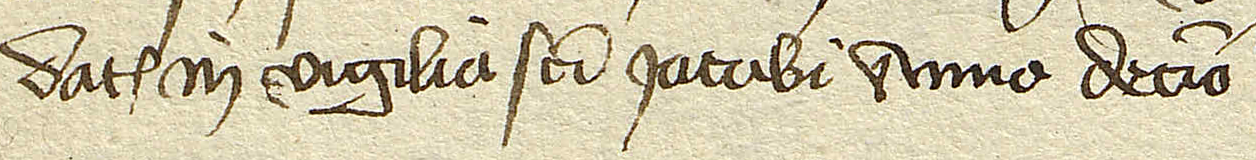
dat* in vigilia ſci* Iacobi Anno decio*
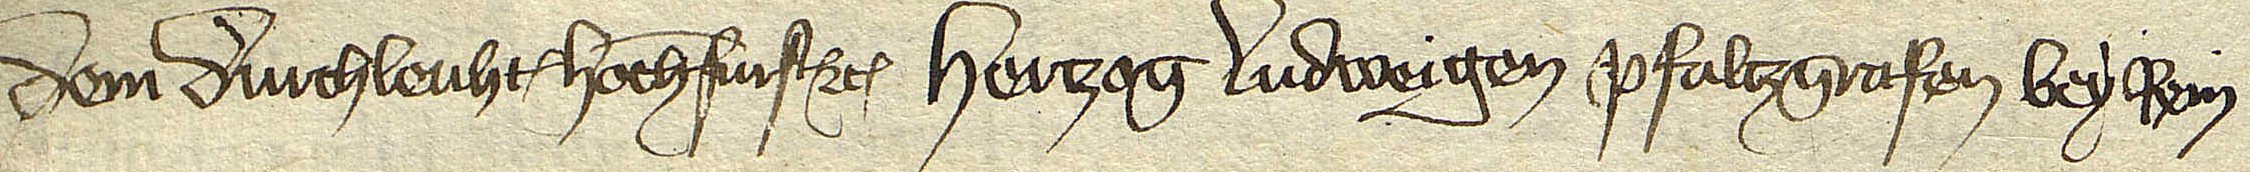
Dem Durchleuht* hoch* furſt* ec* hercʒog Ludweigen pfalcʒgrafen bey Rein
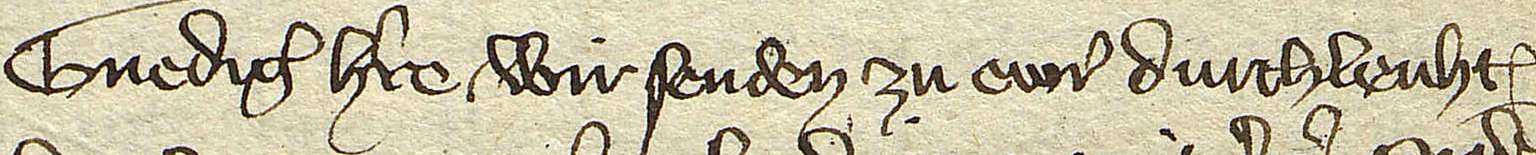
Gnedig* h*re / wir ſenden cʒu ewr* durchleuht*
